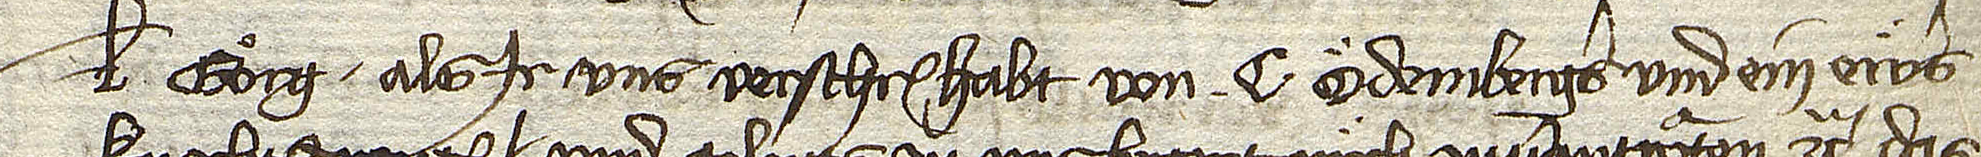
L* Görg / als Ir vns verſchr* habt von C* Ödemberg*s vnd ein eẅ*s
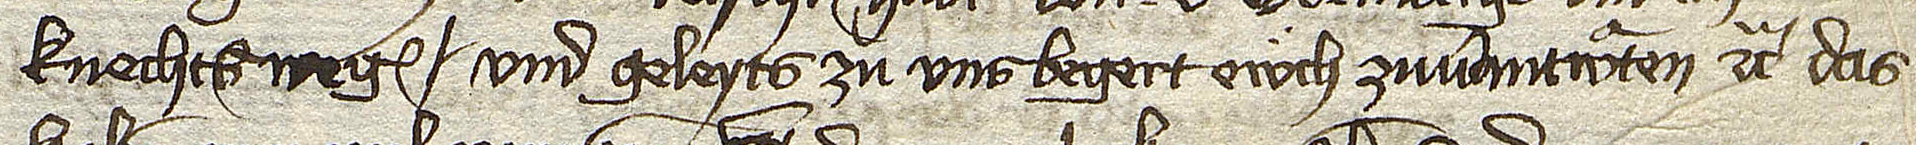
knechts weg* / vnd geleyts ʒu vns begert eẅch ʒuu*antw*ten ec* das
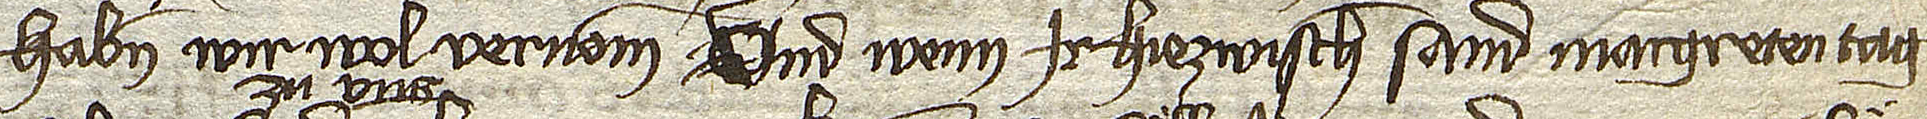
habn* wir wol vernom* / Vnd wenn Ir hieʒwiſch* ſand margreten tag
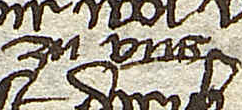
ʒu vns
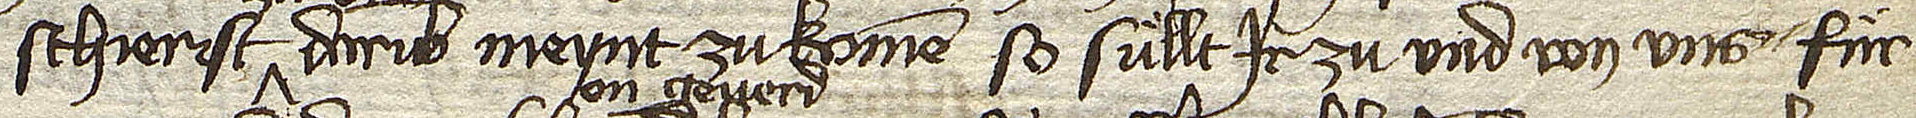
ſchieriſt darub* meynt ʒu kome* ſo ſüllt Ir ʒu vns von vns / für
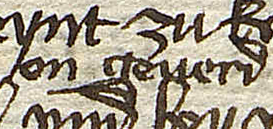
on geuerd
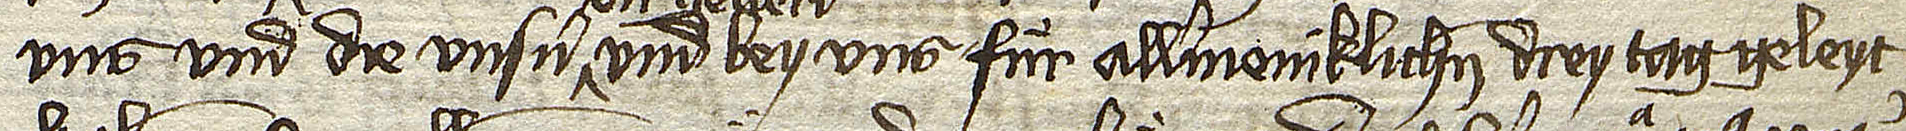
vns vnd die vnſn* vnd bey vns für all*meniklichn* drey tag geleyt
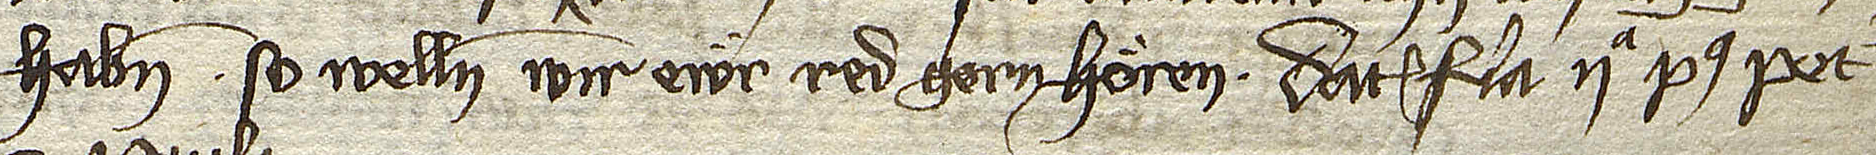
habn* . ſo welln* wir eẅr red gern hören . Dat* fi*a ii* p* pet*
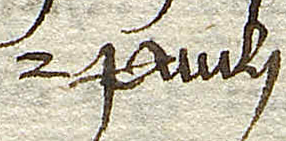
@ Pauli
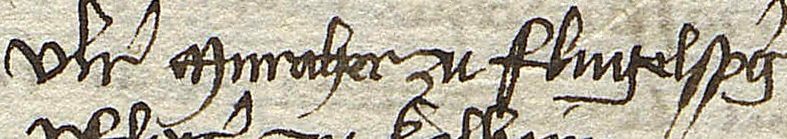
vlr* Muraher ʒu flugelſp*g
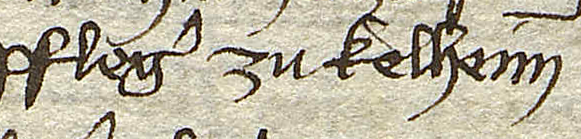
pfleg* ʒu kelheim
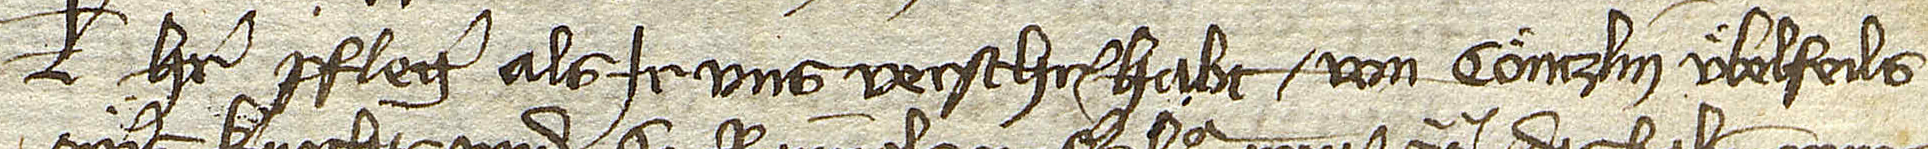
L* hr* pfleg* als Ir vns verſchr* habt / von Cöncʒlin v̈belfeils
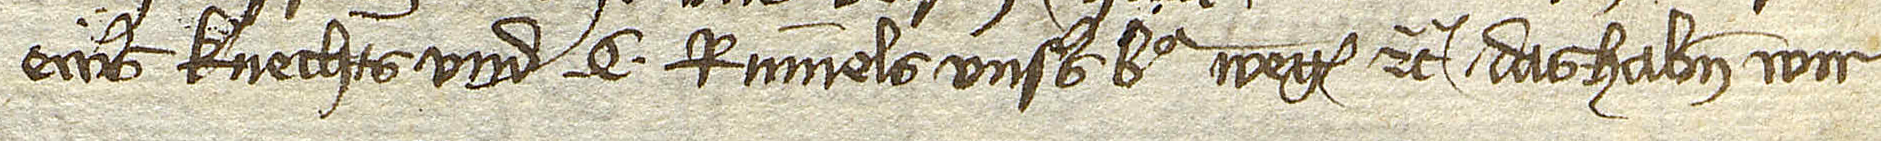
eẅ*s knechts vnd C* Rum*els vnſ*s b* weg* ec* / das habn* wir
